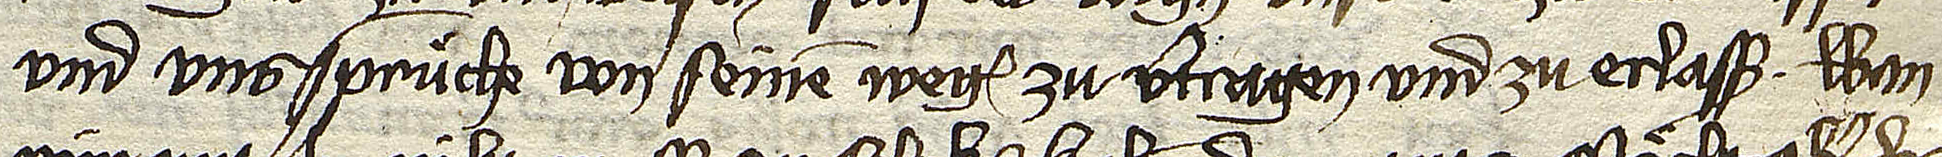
vnd vns ſprüche von ſeine* weg* ʒu v*tragen vnd ʒu erlaſſ* . Wan
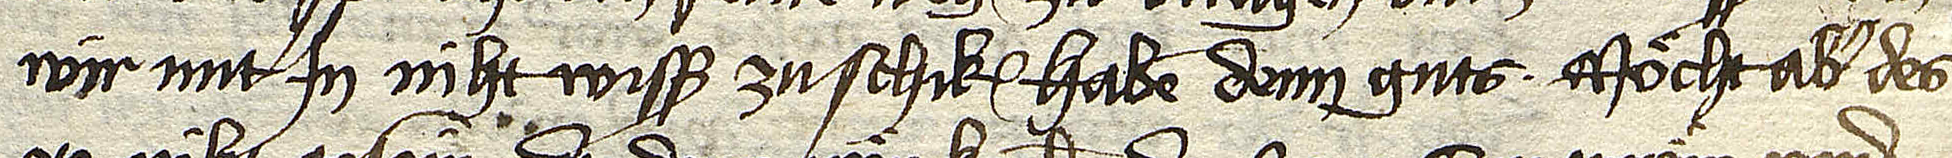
wir mit In niht wiſſ* ʒu ſchik* habe* denn guts . Möcht ab* des
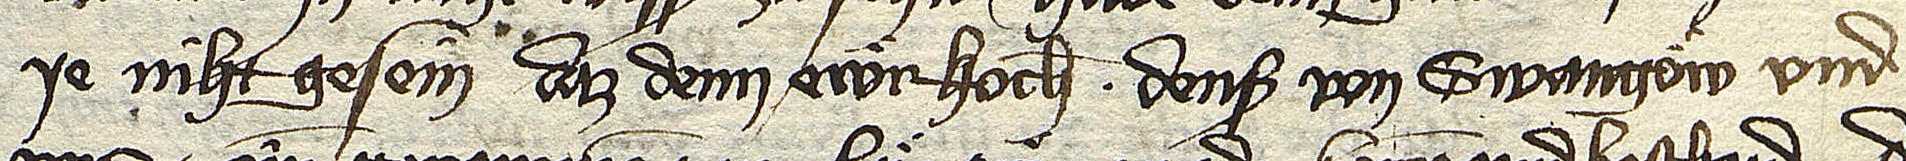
ye niht geſein daʒ denn ewr hoch* . denſ* von Swangöw vnd
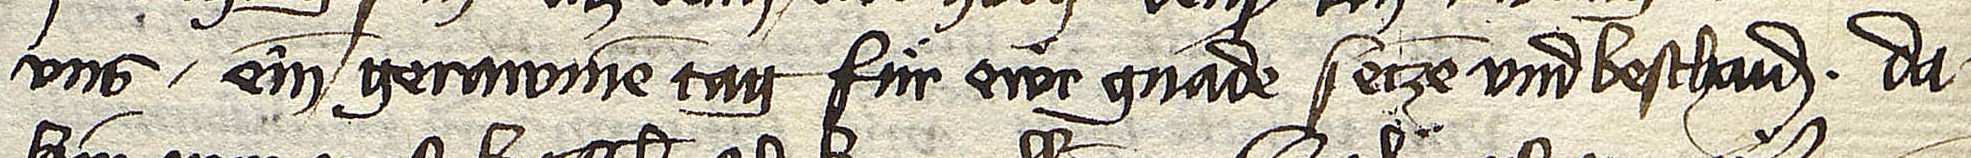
vns / ein gerawme* tag für ewr gnade ſecʒe* vnd beſchaid* . Da -
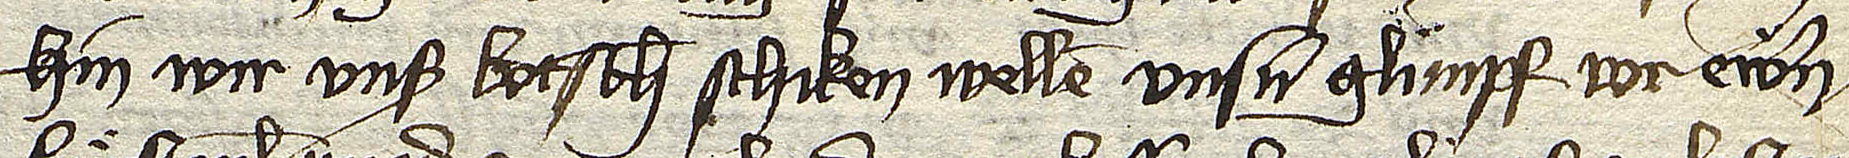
hin wir vnſ* botſch* ſchiken welle* vnſ*n glimpf vor ew*n
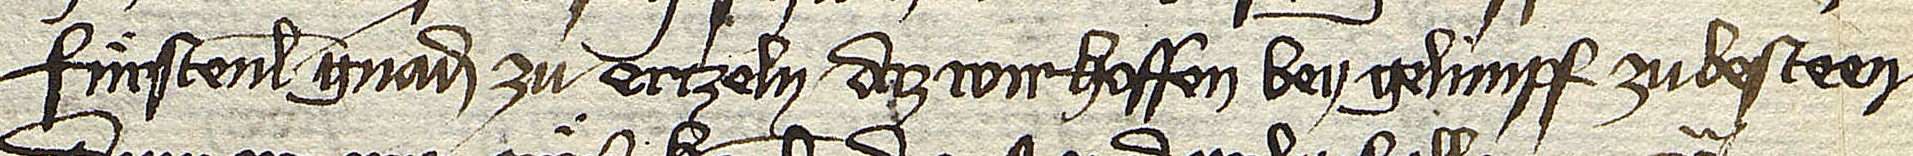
fürſtenl* gnad* ʒu ercʒeln / daʒ wir hoffen bey gelimpf ʒu beſteen
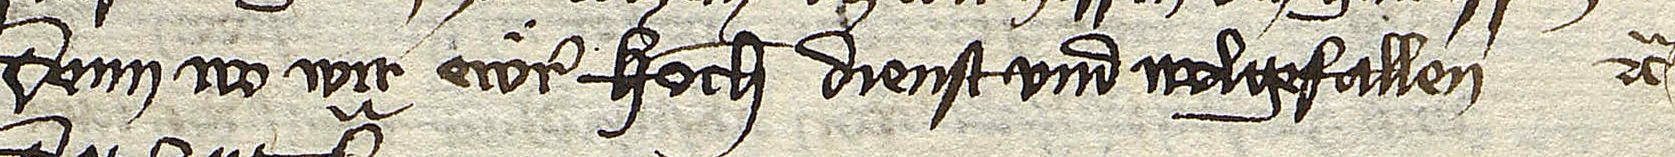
Denn wo wir ewr* hoch* dienſt vnd wolgefallen ec*
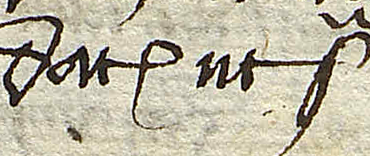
Dat* ut ſ*
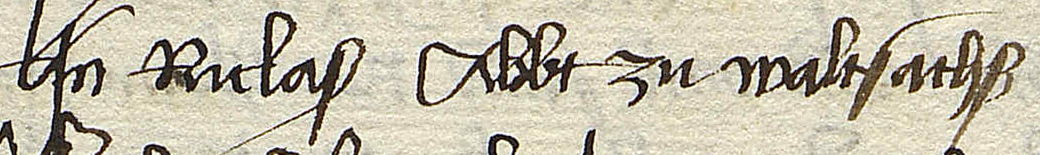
H*n Niclaſ* Abbt ʒu waltſachſ*
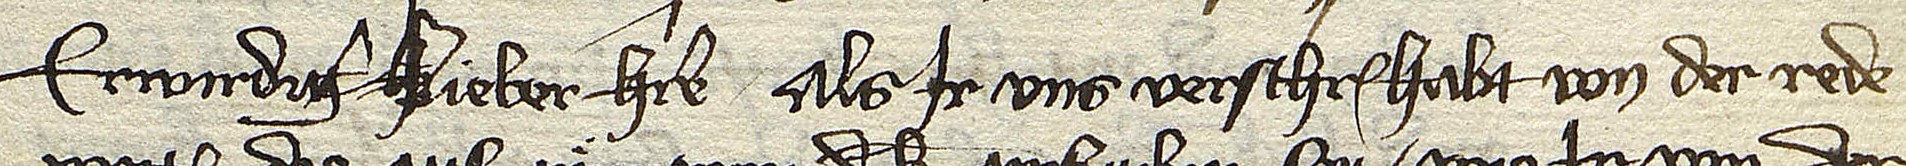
Erwirdig* lieber h*re / Als Ir vns verſchr* habt von der rede
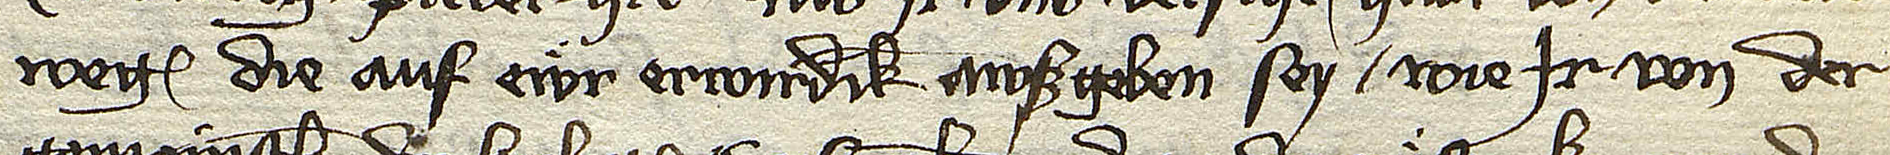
weg* die auf ewr erwirdik* awſʒ geben ſey / wie Ir von der
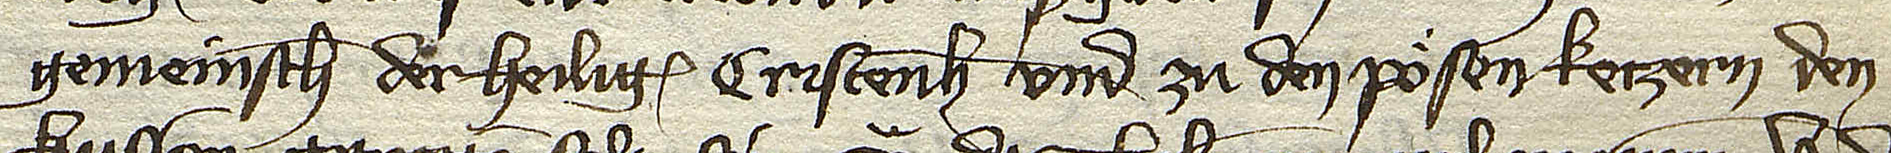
gemeinſch* der heilig* Criſtenh* vnd ʒu den pöſen kecʒern den
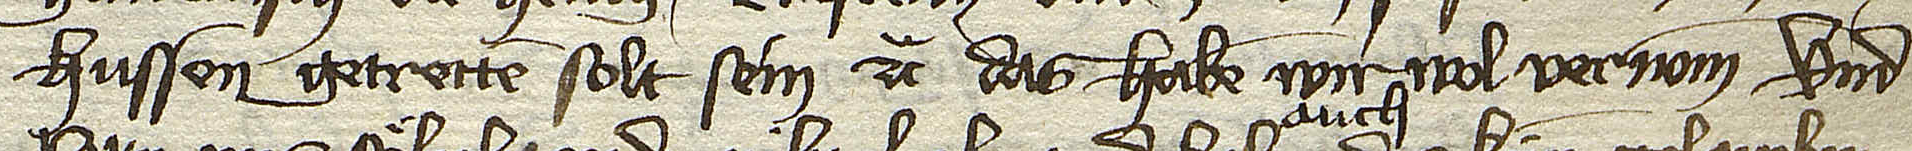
huſſen getrette* ſolt ſein ec* das habe* wir wol vernom* / Vnd
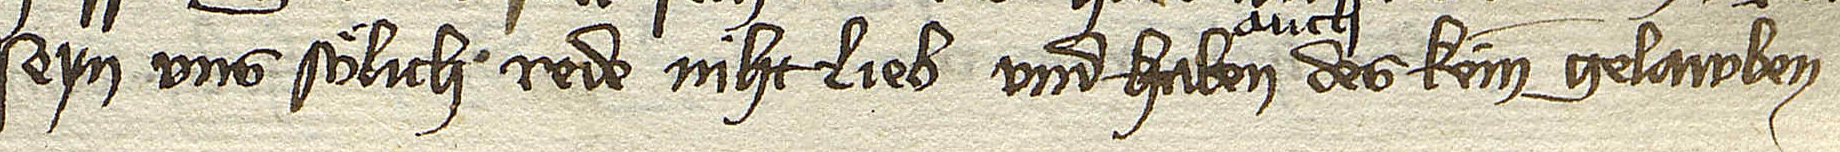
ſeyn vns ſölich* rede niht lieb vnd haben des kein* gelawben
